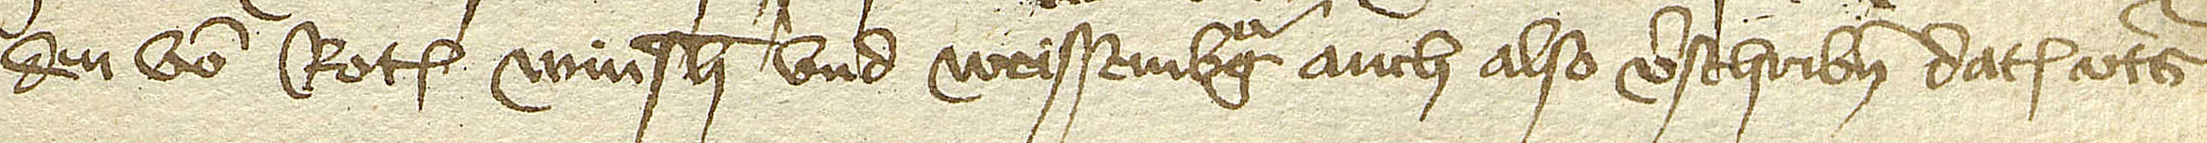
den vo* Rot* winſh* vnd weiſſemb*g auch alſo v*ſchribn* dat* vts*
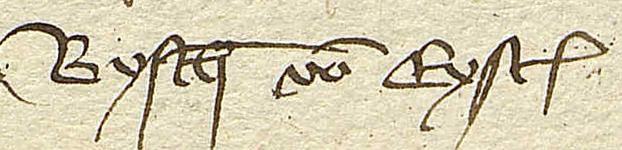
Byſch* vo* Eyſt*
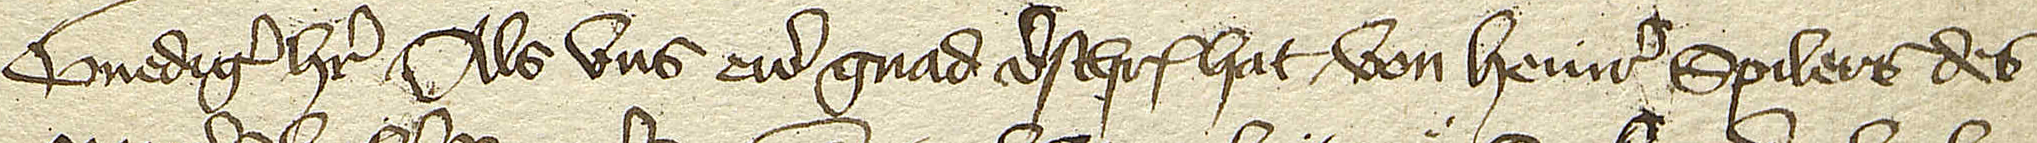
Gnedig* hr* / Als vns ew* gnad v*ſchr* hat / von heinr* Spilers des
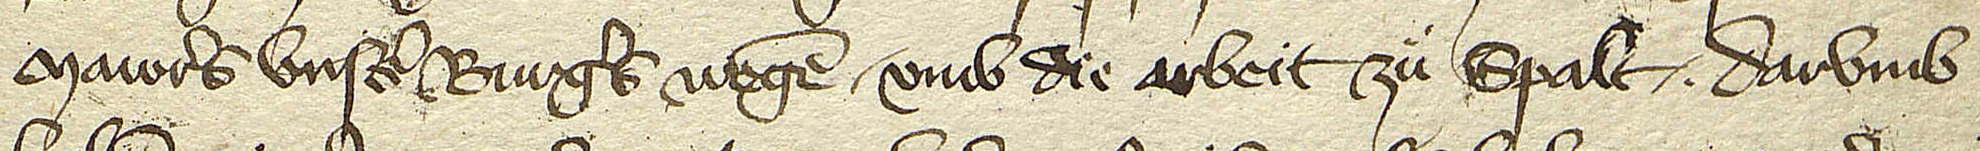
Mawr*s vnſs* Burg*s wege* / vmb die arbeit cʒü Spalt / . Darvmb
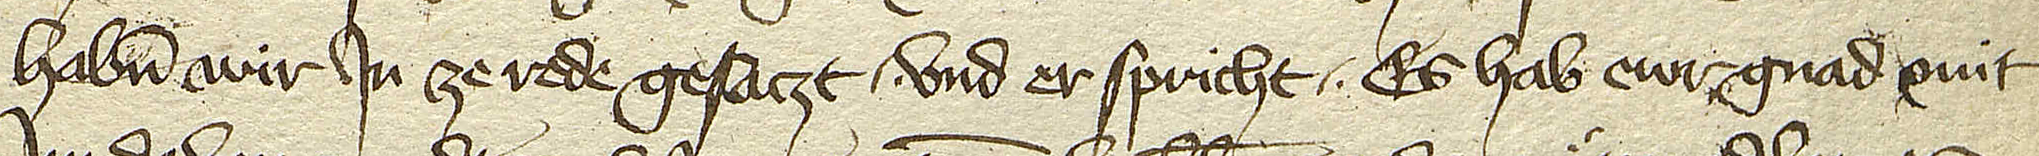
habn* wir In cʒe rede geſacʒt / . vnd er ſpricht / . Es hab ewr gnad mit
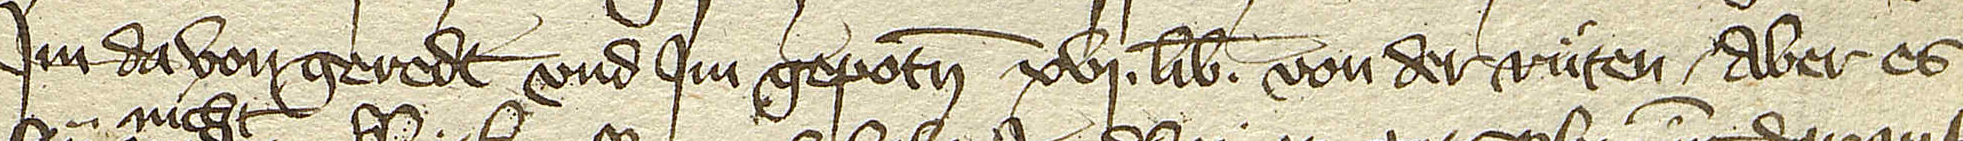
Im davon geredt vnd Im gepotn* xvi . lib* . von der rüten / Aber es
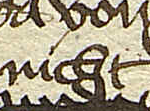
nicht
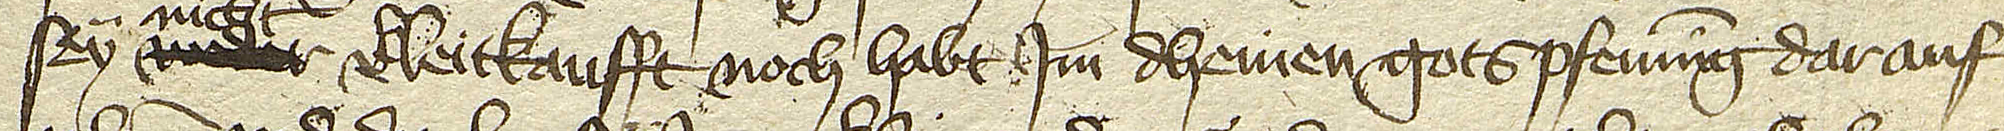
ſey weder v*leitkaufft noch habt Im dheinen gots pfennig* darauf
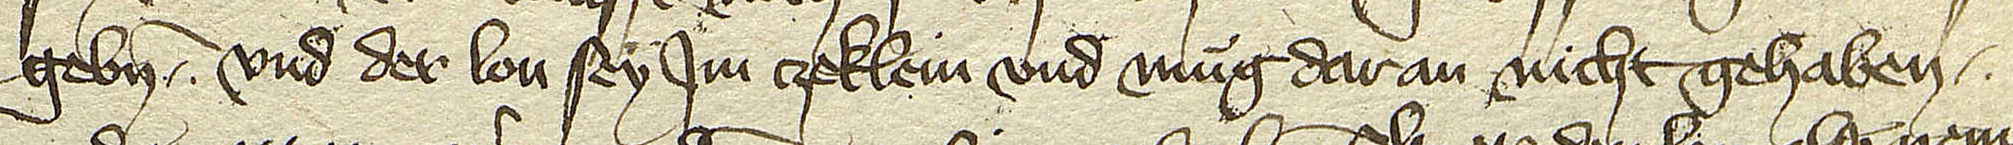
gebn* / . vnd der lon ſey Im cʒeklein vnd müg daran nicht gehaben / .
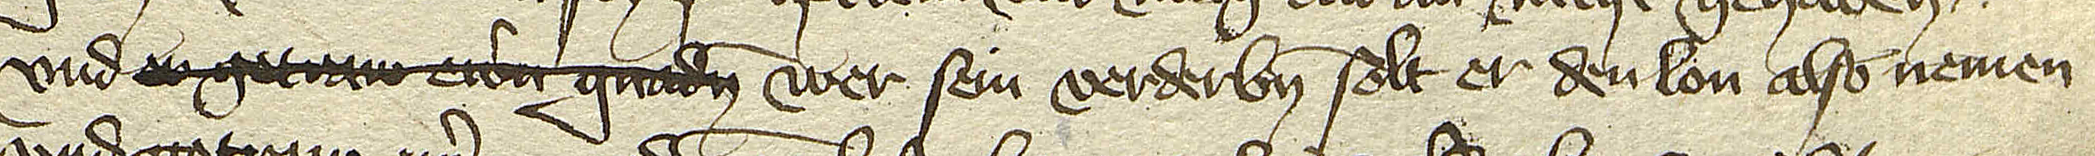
vnd er getraw ewn* gnadn* wer ſein verderbn* ſolt er den lon alſo nemen
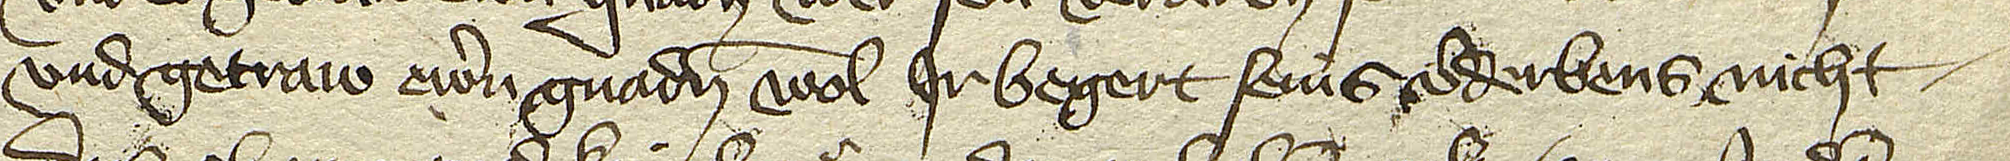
vnd getraw ew*n gnadn* wol Ir begert ſeins v*derbens nicht /
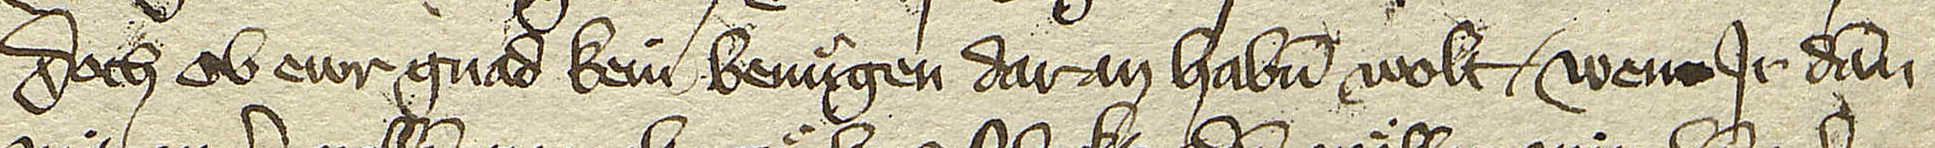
Doch ob ewr gnad kein benügen daran habn* wolt / wene Ir dan*
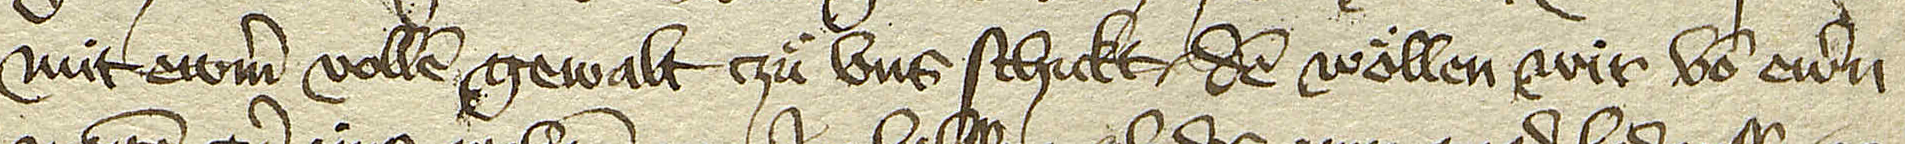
mit ewm* volle* gewalt cʒü vns ſchickt / d* wöllen wir vo* ewn*
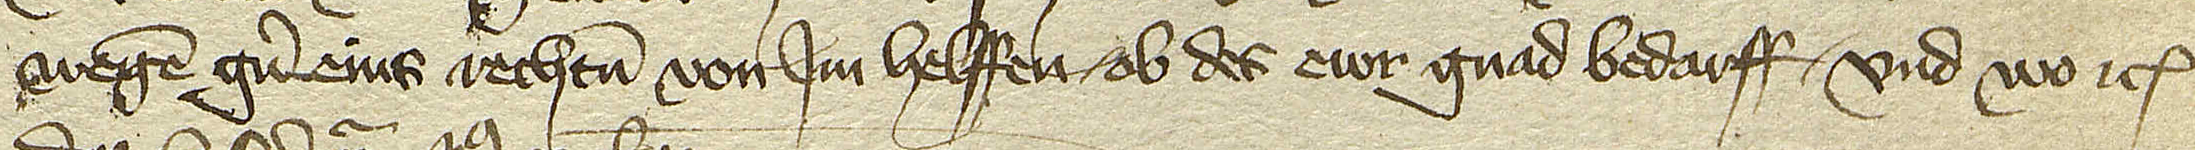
wege* gn* eins rechtn* von Im helffen / ob der ewr gnad bedarff / vnd wo ec*
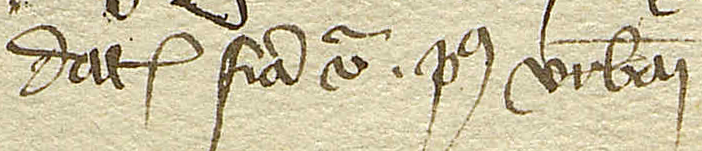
dat* fia* v* . p* vrbai*
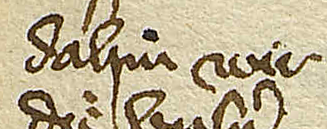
dahin wir
